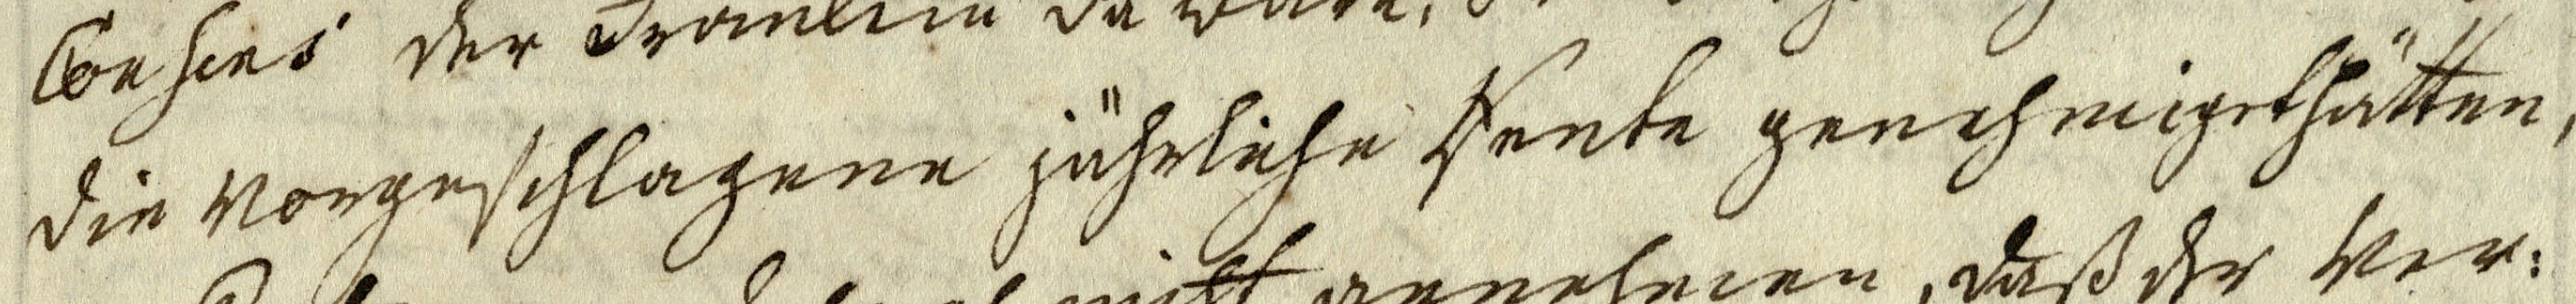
die vorgeschlagene jährliche Rente genehmiget hätten,
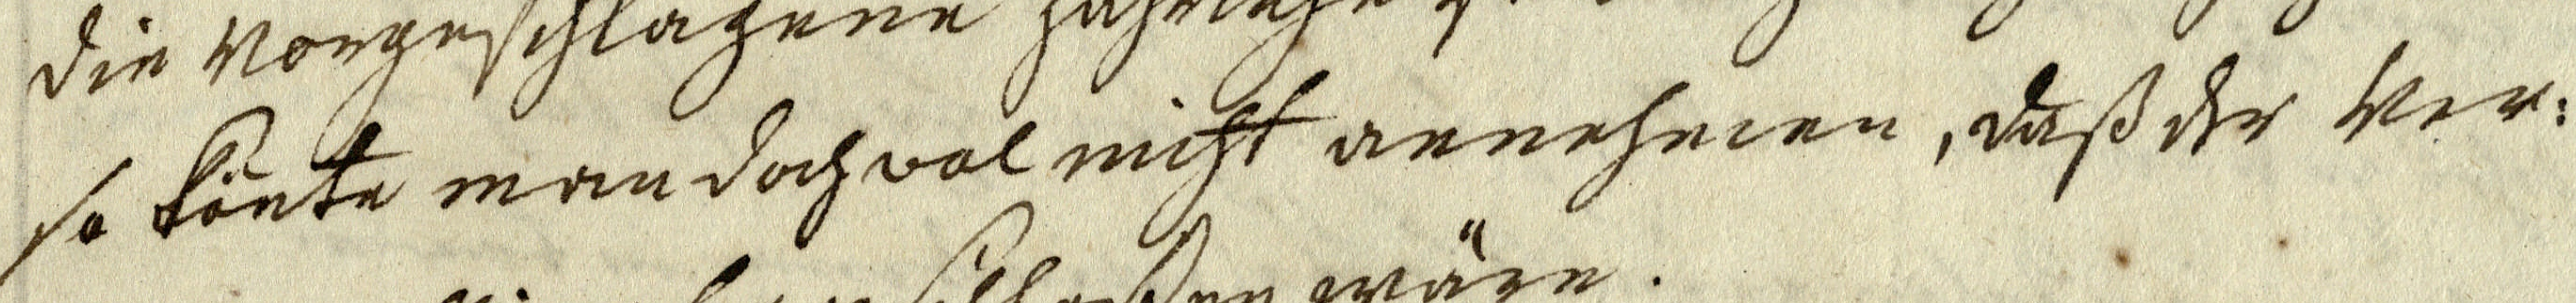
so könte man doch wol nicht annehmen, daß der Ver¬
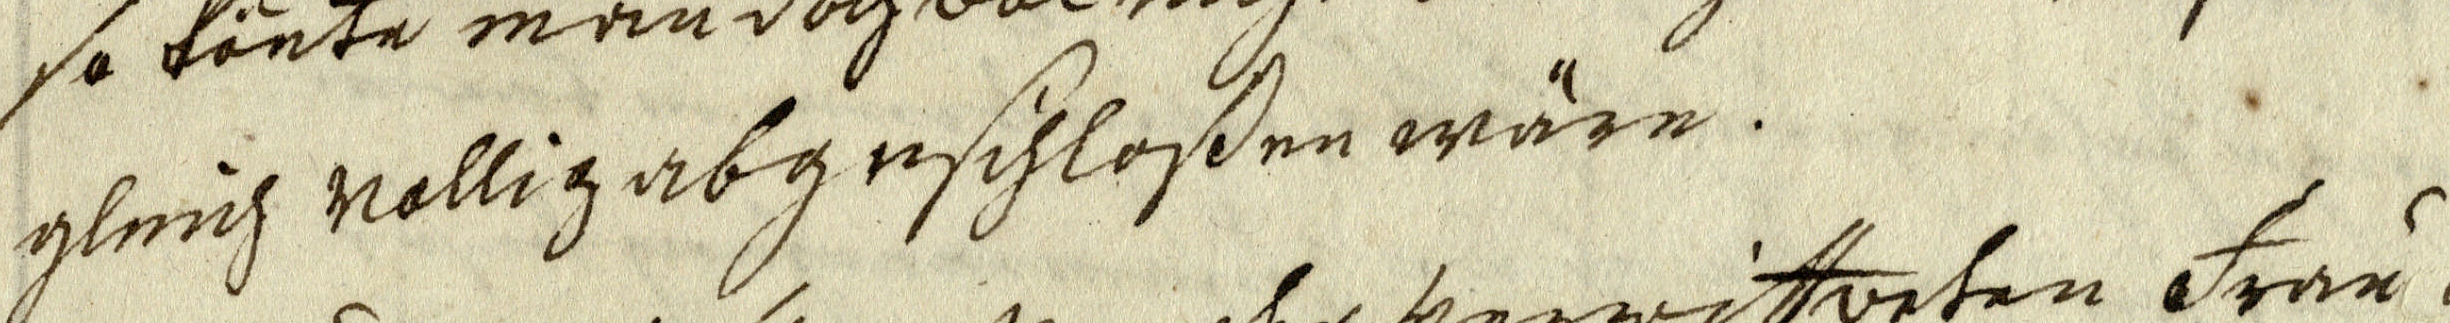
gleich vollig abgeschloßen wäre.
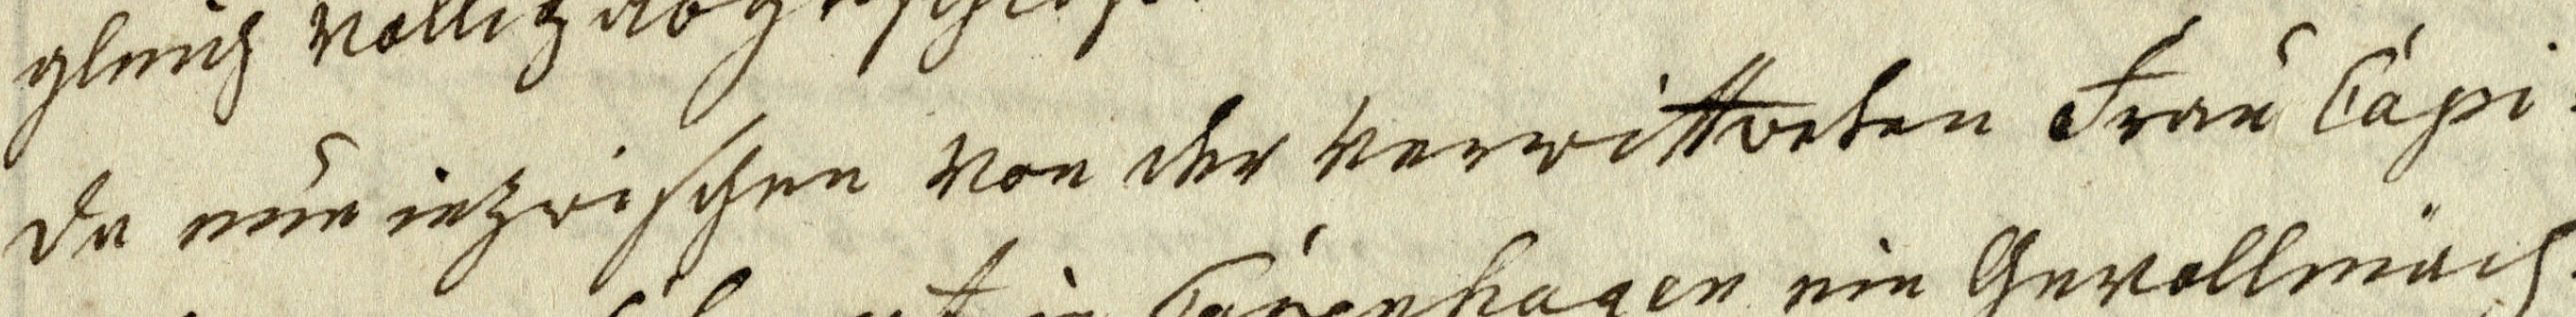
Da nun inzwischen von der verwittweten Frau Capi¬
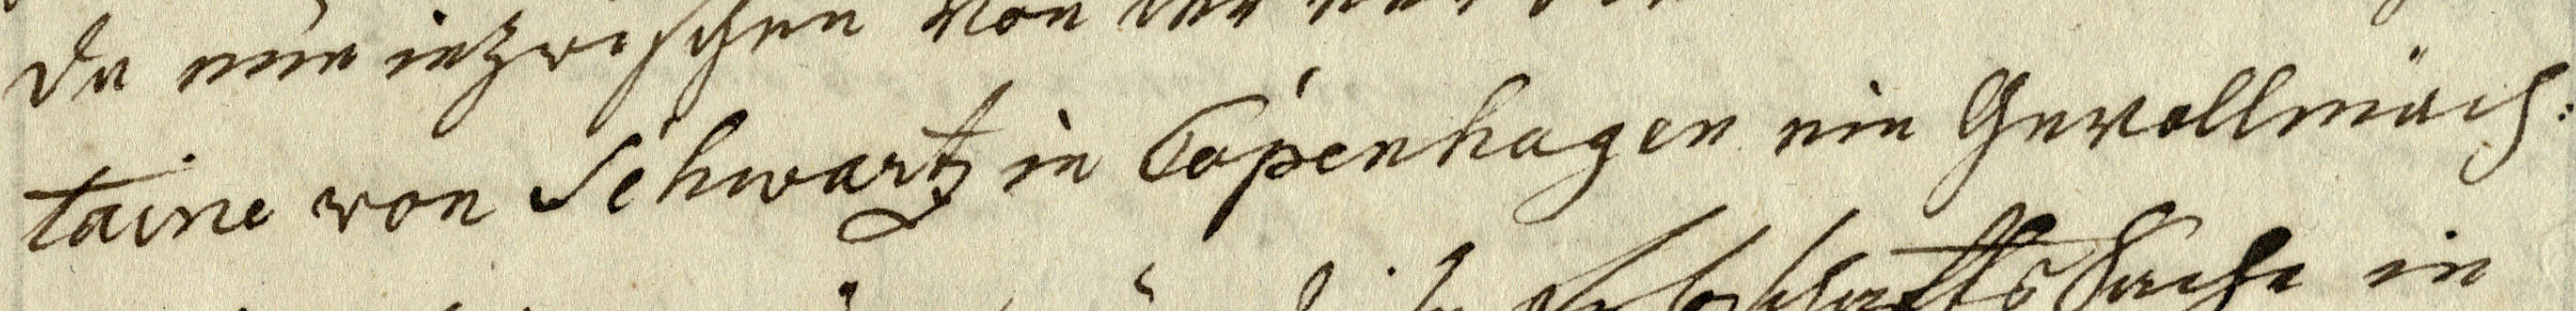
taine von Schwartz in Copenhagen ein Gevollmäch¬
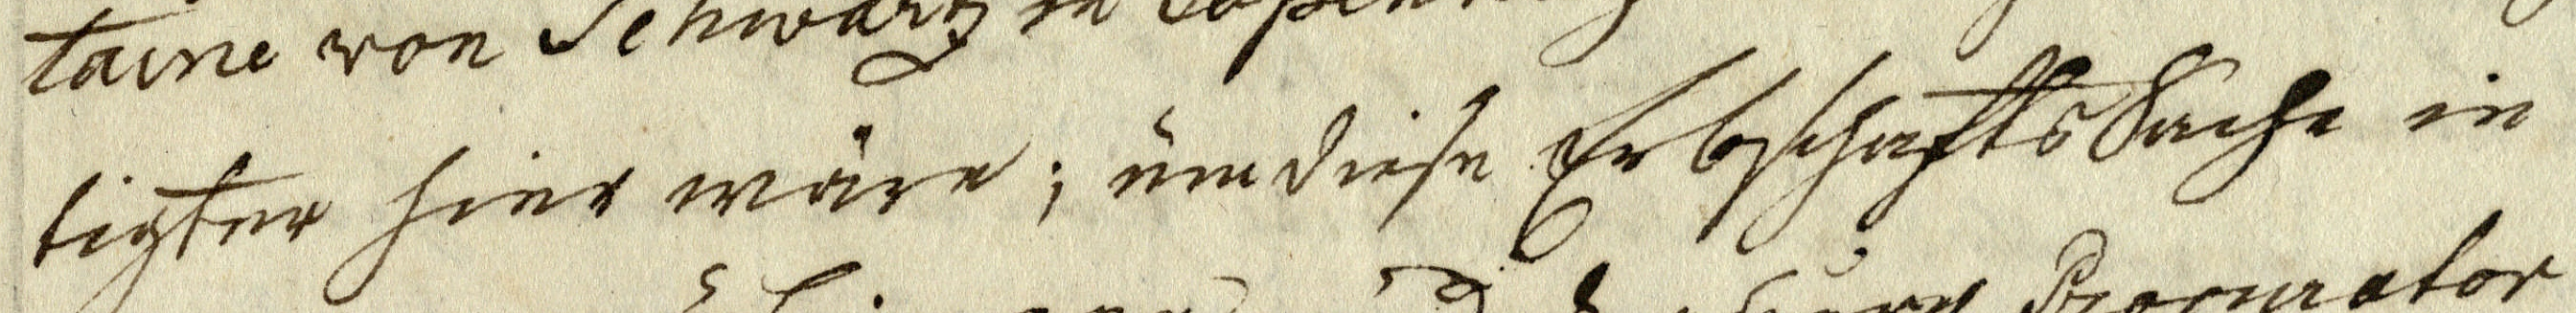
tigter hier wäre; um diese ErbschaftsSache in
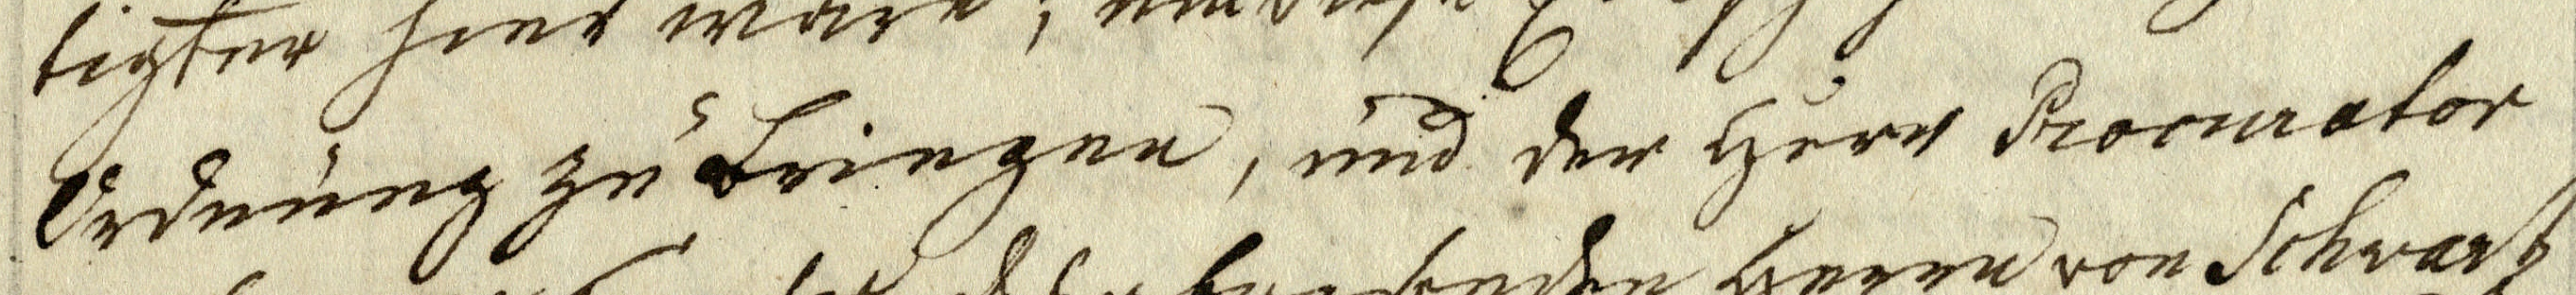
Ordnung zu bringen, und der Herr Procurator
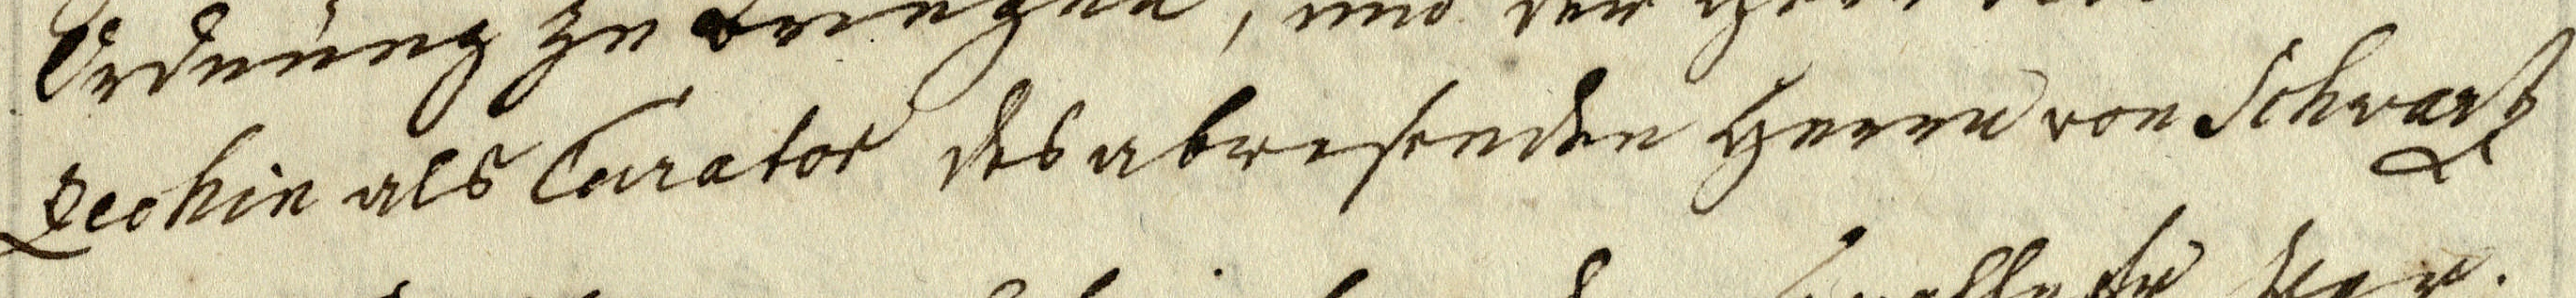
Zechin als Curator des abwesenden Herrn von Schwartz
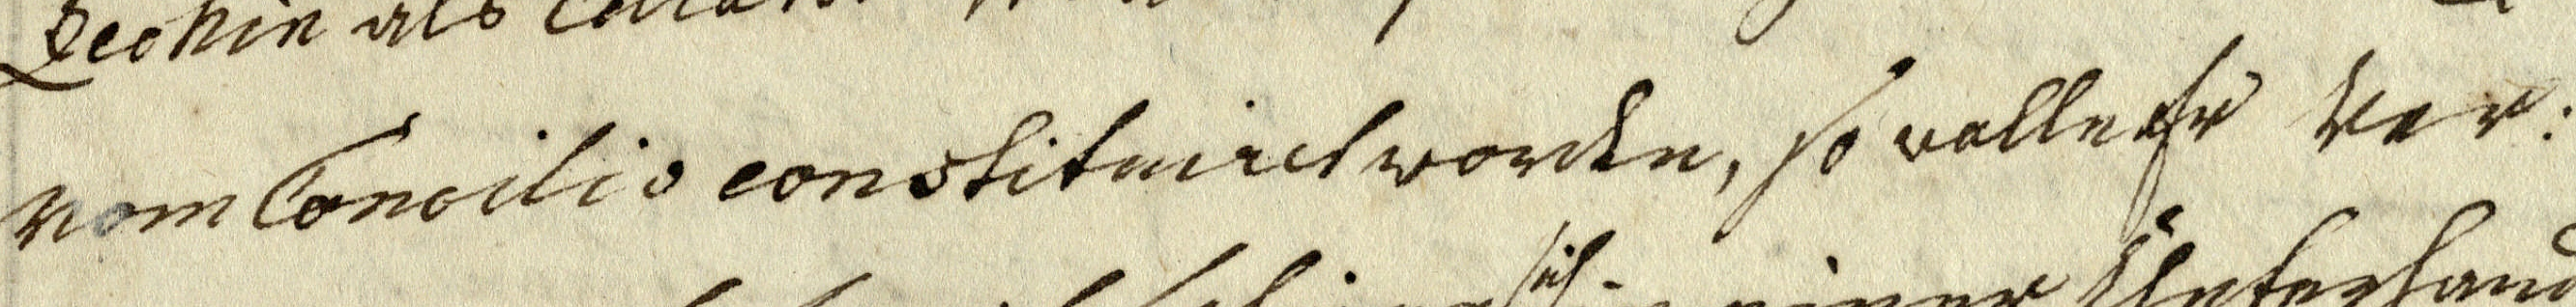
vom Concilio constituiret worden, so wolle Er ver¬
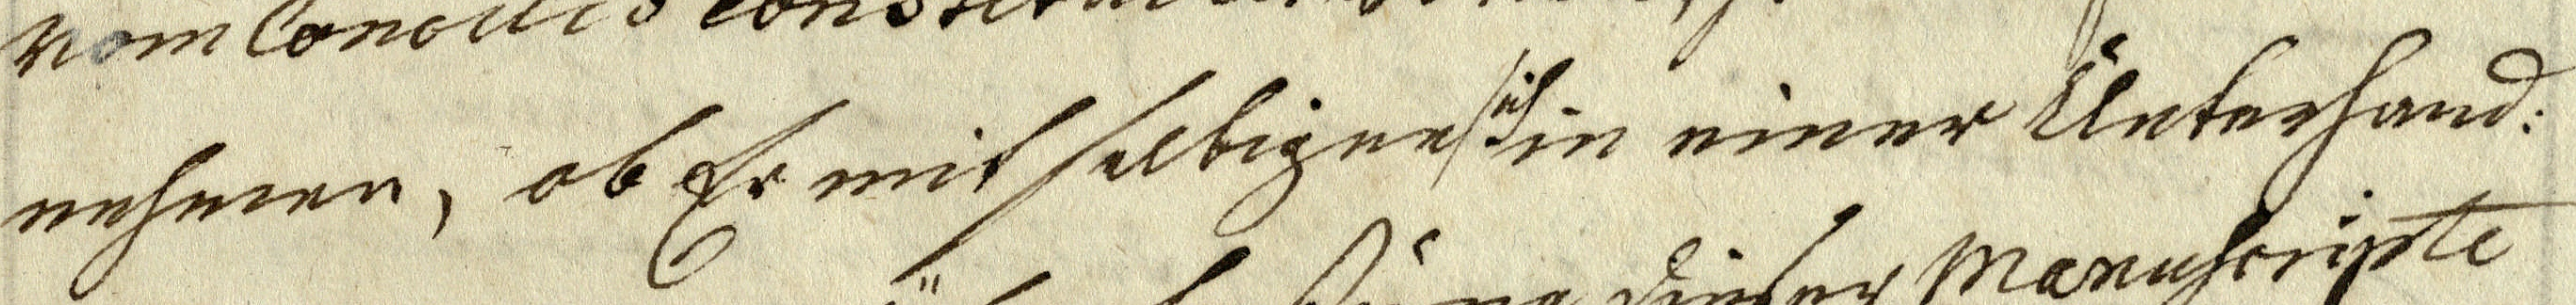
nehmen, ob Er mit selbigen sich in einer Unterhand¬
